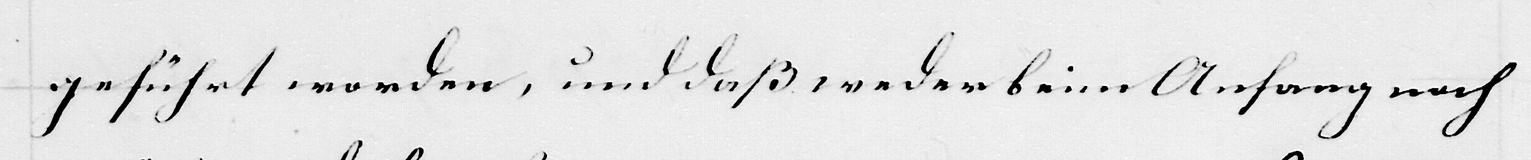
geführt worden, und daß weder beim Anfang noch
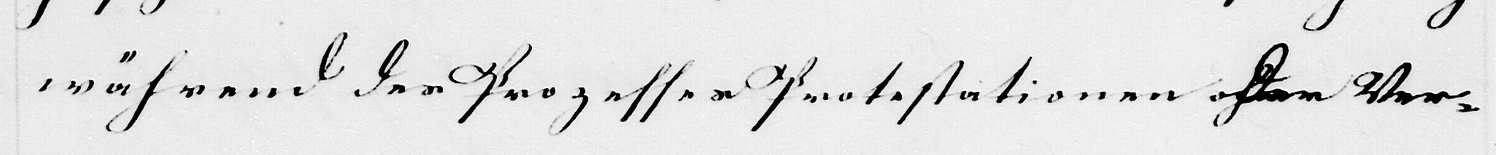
während des Prozesses Protestationen [?oder] Ver¬
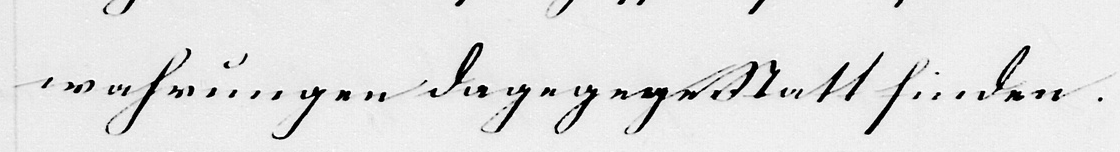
wahrungen dagegen Statt finden.
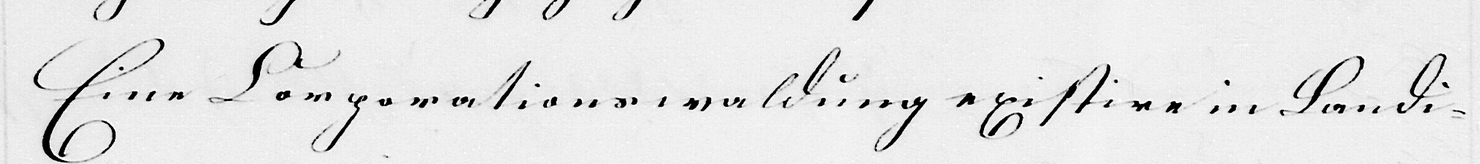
Eine Corporationswaldung existire in Landi¬
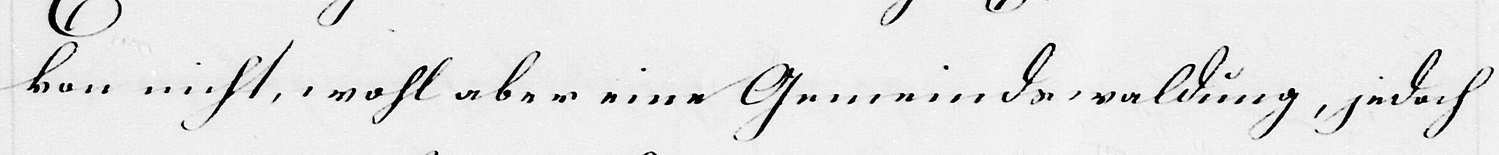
kon nicht, wohl aber eine Gemeindswaldung, jedoch
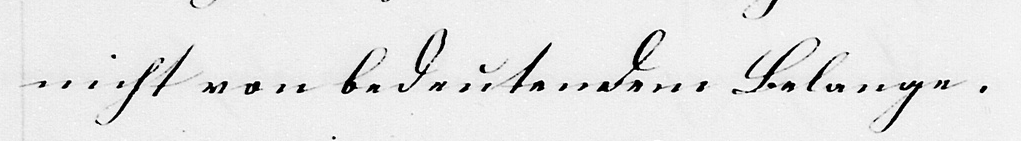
nicht von bedeutendem Belange.
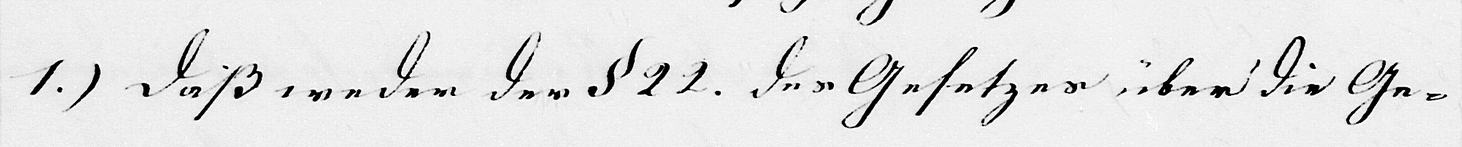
1.) Daß weder der § 22. des Gesetzes über die Ge¬
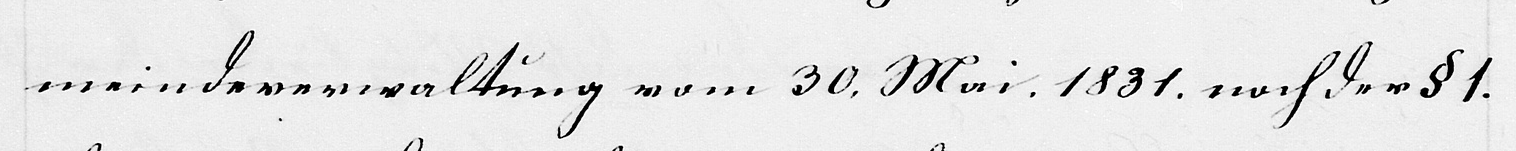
meindeverwaltung vom 30. Mai. 1831. noch der § 1.
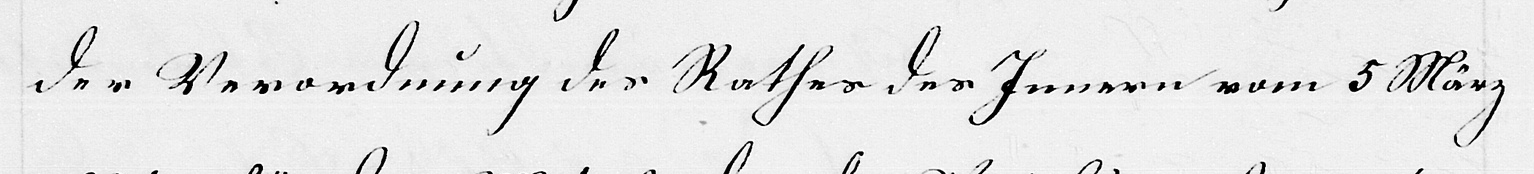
der Verordnung des Rathes des Innern vom 5 März
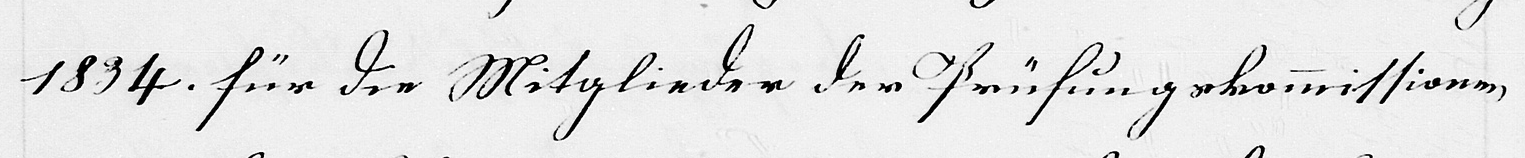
1834. für die Mitglieder der Prüfungskommissionen,
